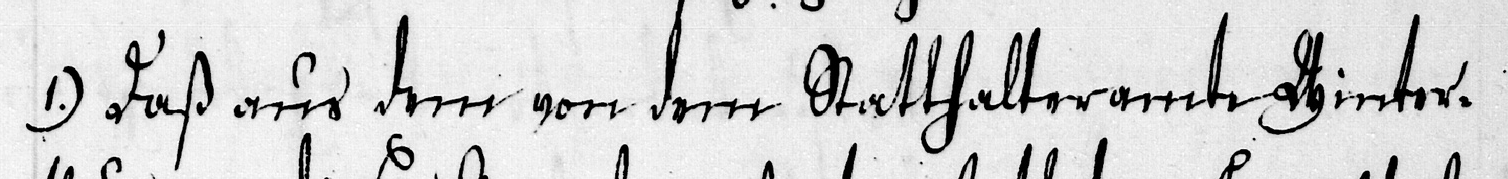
1.) Daß aus dem von dem Statthalteramte Winter¬
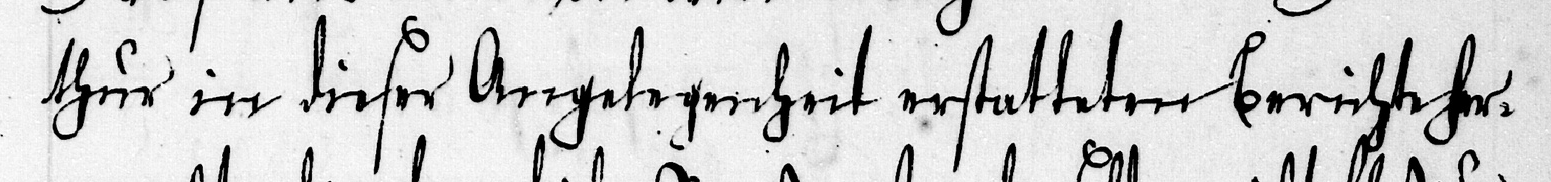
thur in dieser Angelegenheit erstatteten Berichte her¬
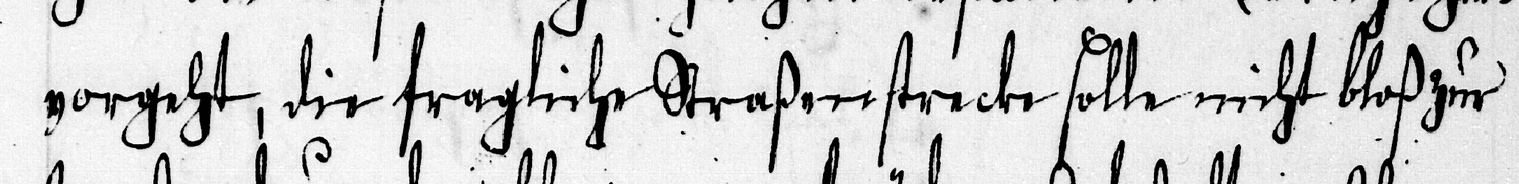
vorgeht, die fragliche Straßenstrecke solle nicht bloß zur
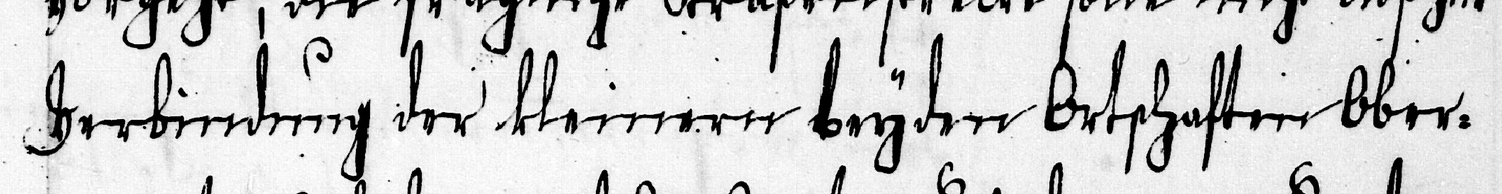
Verbindung der kleinern beyden Ortschaften Ober¬
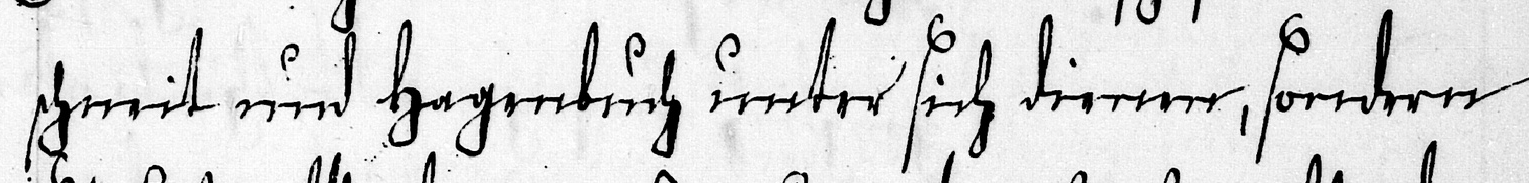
schneit und Hagenbuch unter sich dienen, sondern
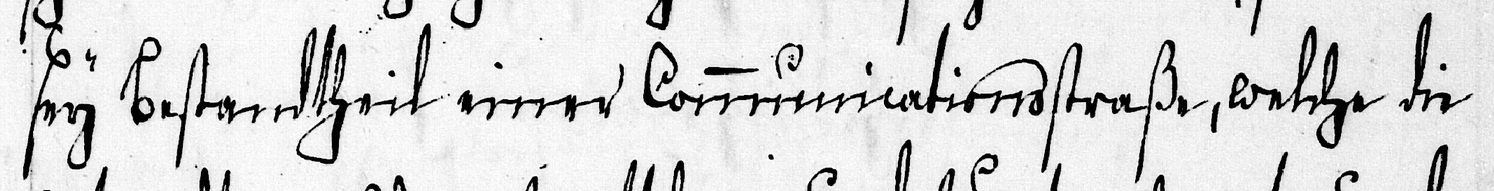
sey Bestandtheil einer Communicationsstraße, welche die
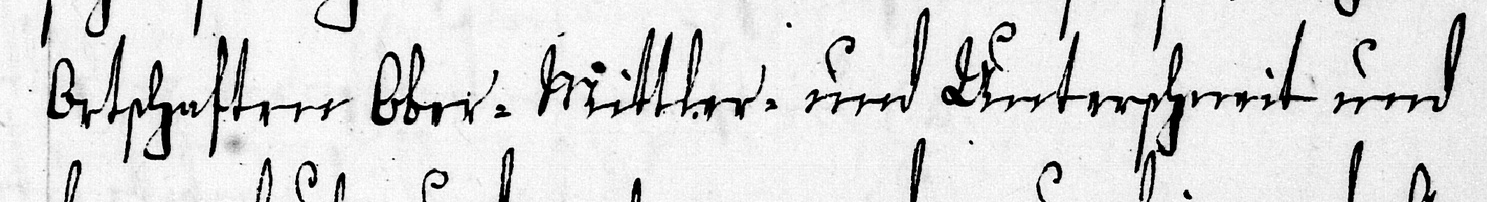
Ortschaften Ober- Mittler- und Unterschneit und
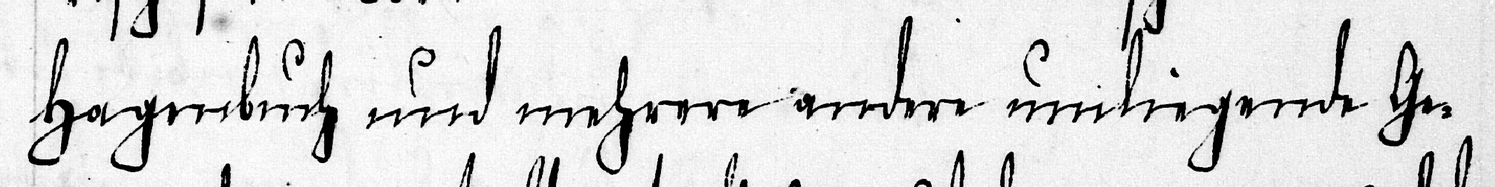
Hagenbuch und mehrere andere umliegende Ge¬
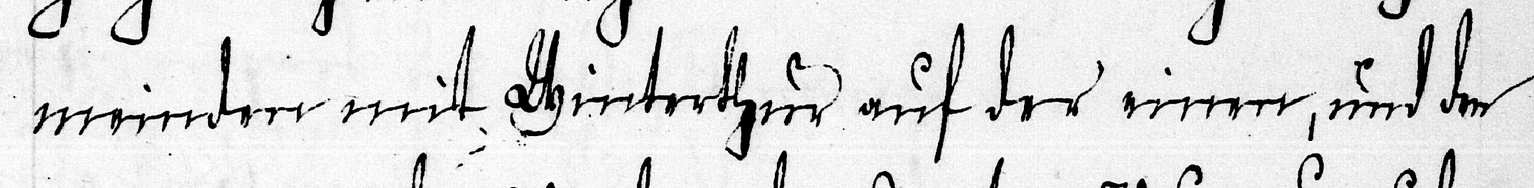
meinden mit Winterthur auf der einen, und den
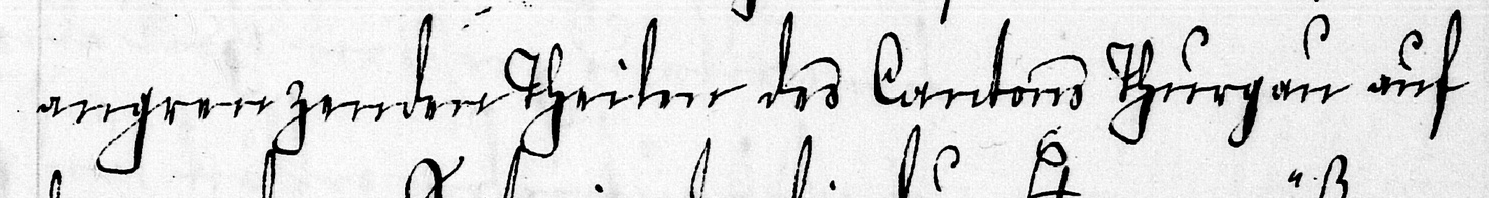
angrenzenden Theilen des Cantons Thurgau auf
